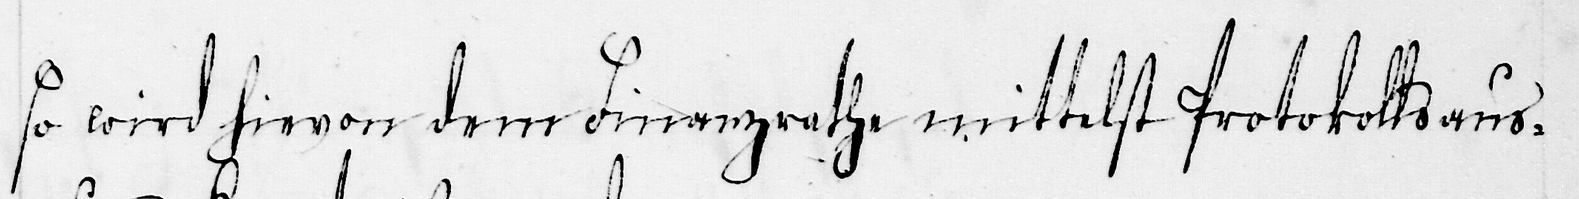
so wird hievon dem Finanzrathe mittelst Protokollsaus¬
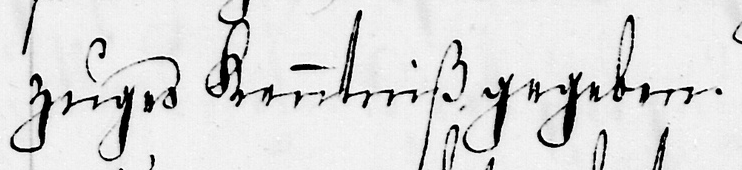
zuges Kenntniß gegeben.
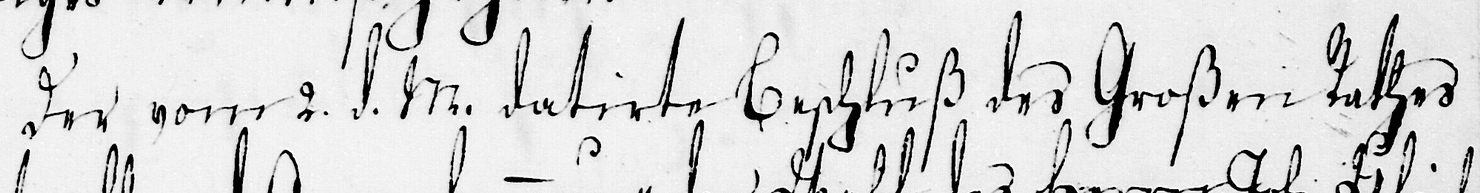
Der vom 2. d. M. datirte Beschluß des Großen Rathes
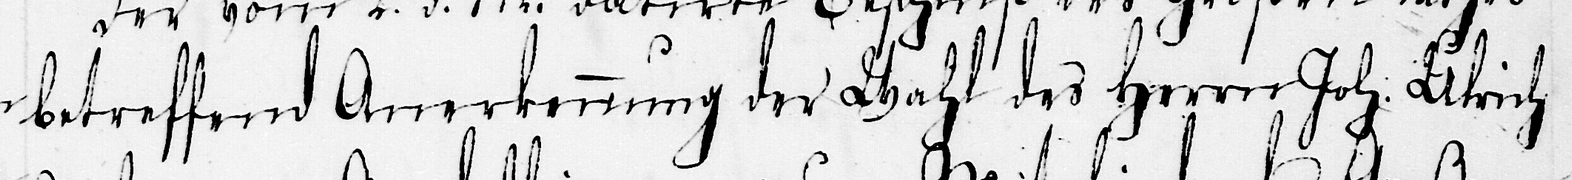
betreffend Anerkennung der Wahl des Herrn Joh. Ulrich
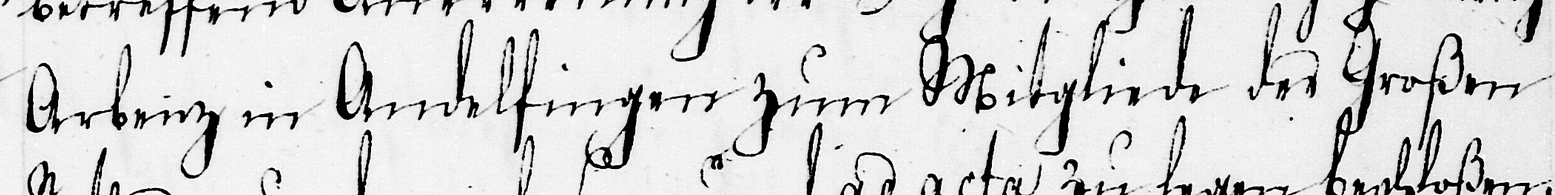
Arbenz in Andelfingen zum Mitgliede des Großen
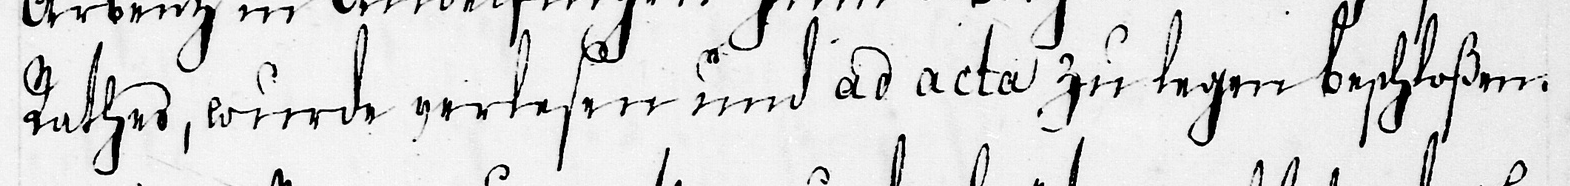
Rathes, wurde verlesen und ad acta zu legen beschloßen.
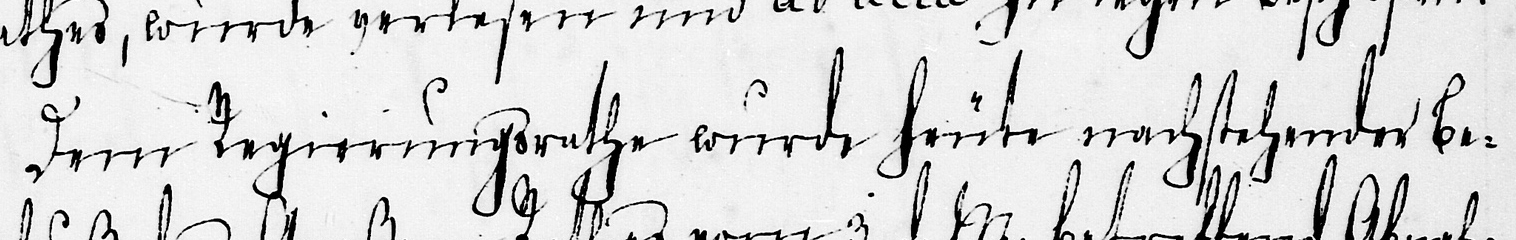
Dem Regierungsrathe wurde heute nachstehender Be¬
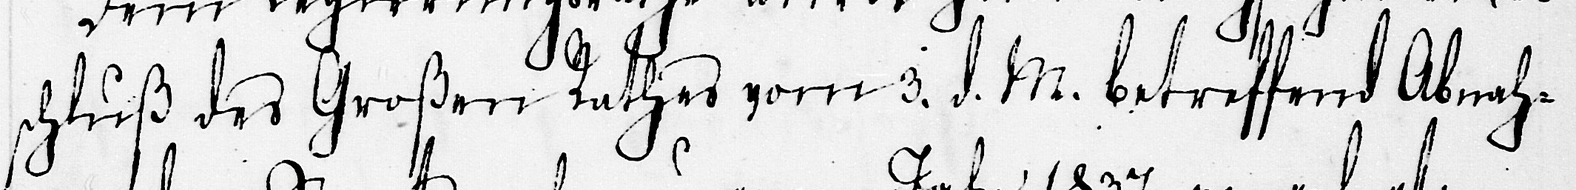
schluß des Großen Rathes vom 3. d. M. betreffend Abnah¬
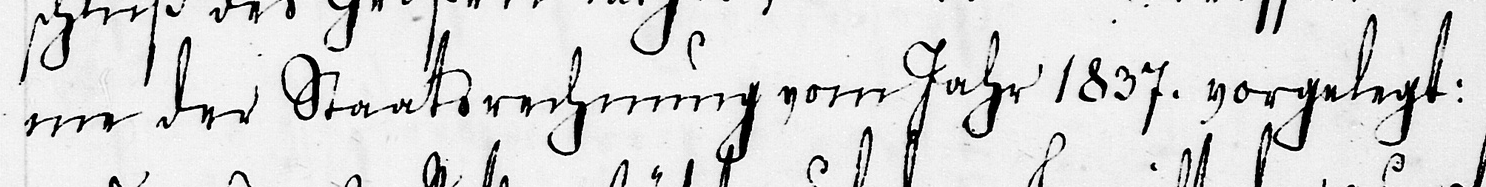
me der Staatsrechnung vom Jahr 1837. vorgelegt:
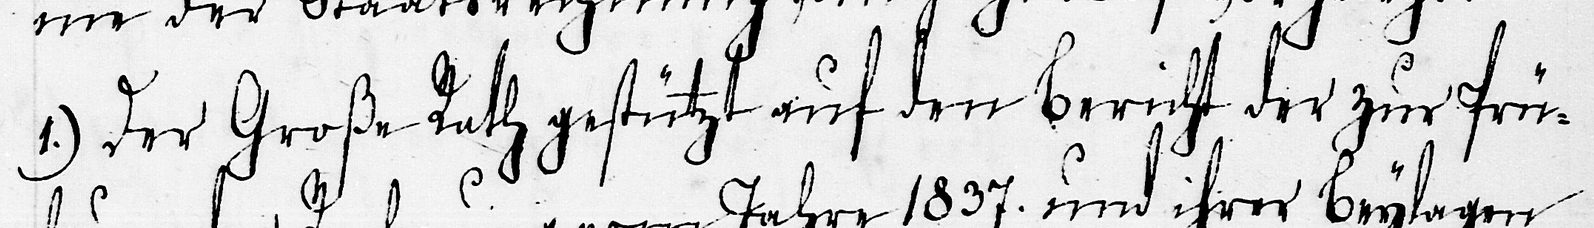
1.) Der Große Rath gestützt auf den Bericht der zur Prü¬
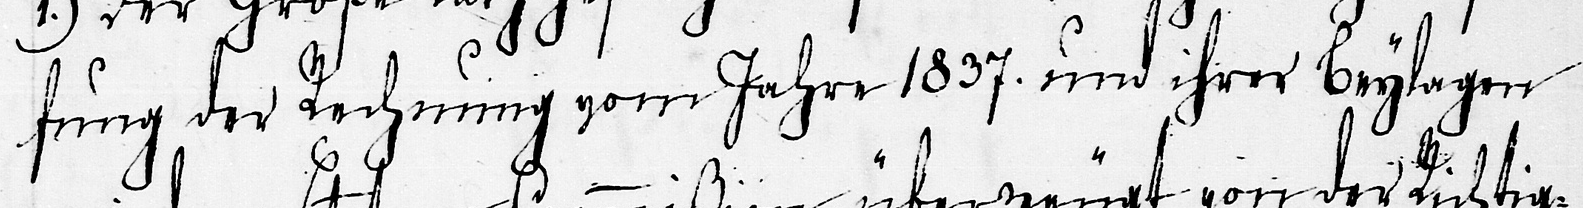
fung der Rechnung vom Jahre 1837. und ihrer Beylagen
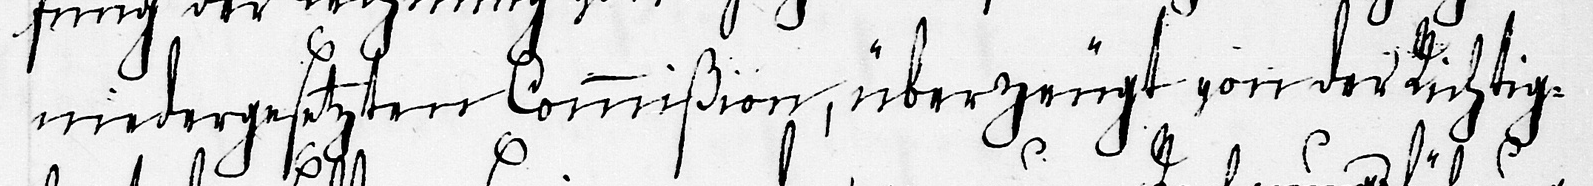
niedergesetzten Commißion, überzeugt von der Richtig¬
